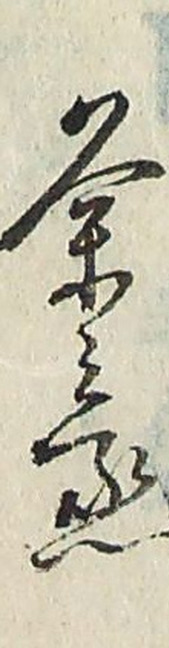粂之丞
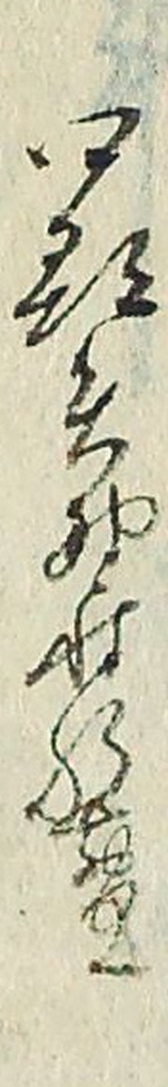同郡矢野村肝煎
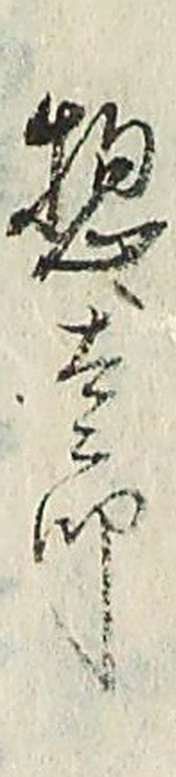惣太郎
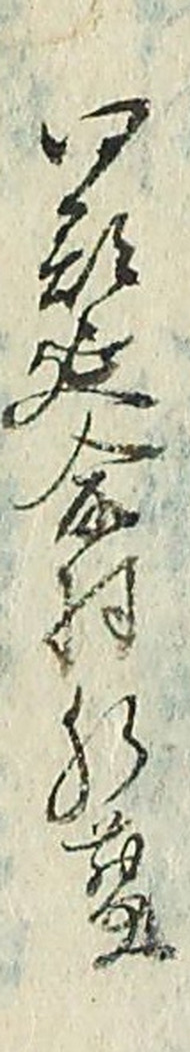同郡延命村肝煎
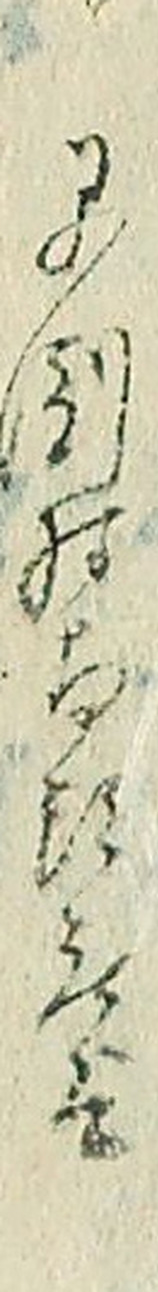早淵村与頭庄屋
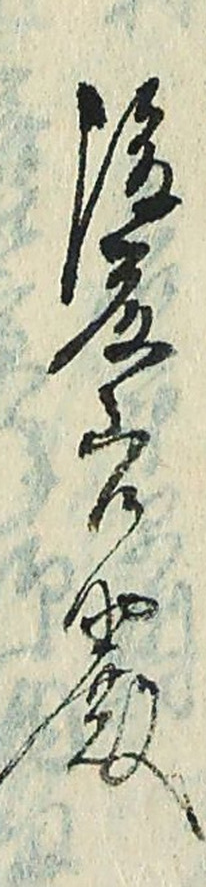後藤善助殿
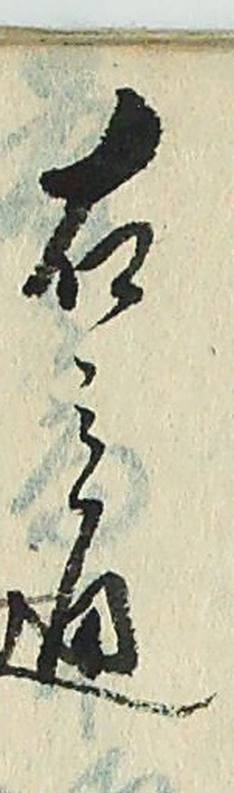右之通
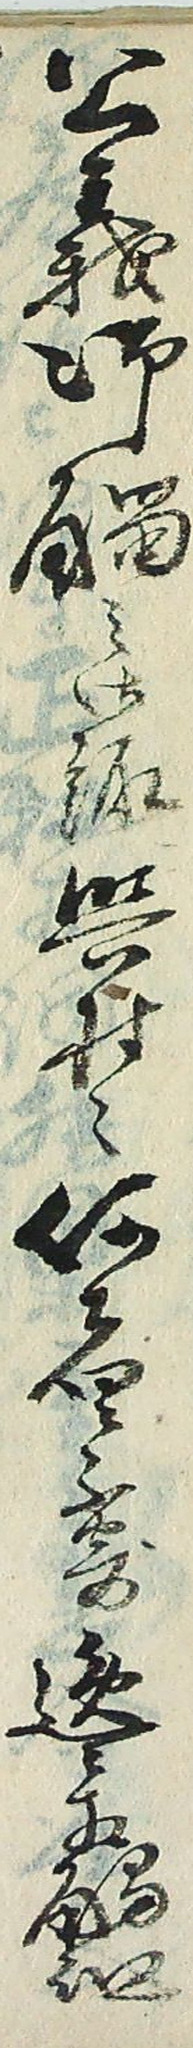公儀御触之御趣与村々何者に不寄逸々相触組
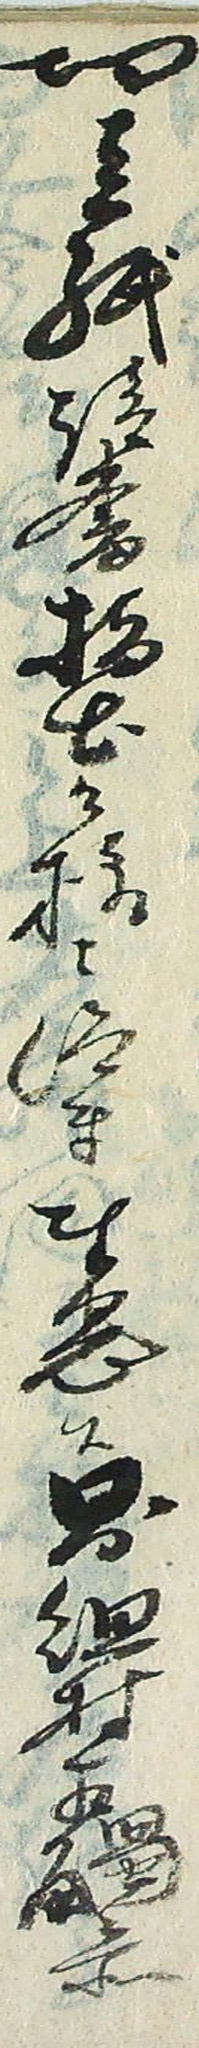切壱紙請書指出候様被仰付奉畏候則組村相触候所
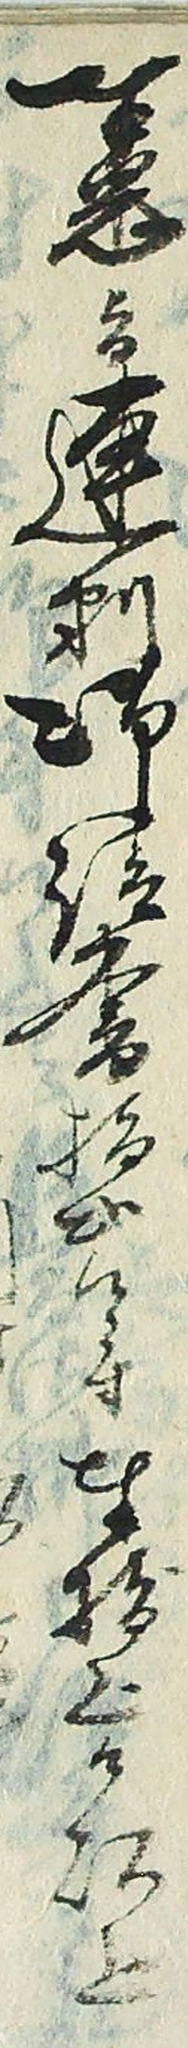奉畏旨連判御請書指出候に付奉指上候以上
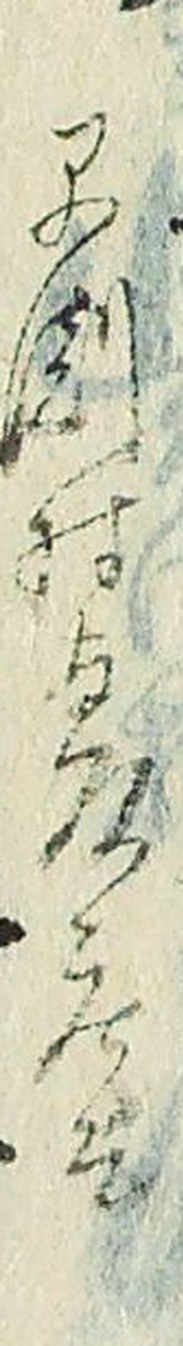早淵村与頭庄屋
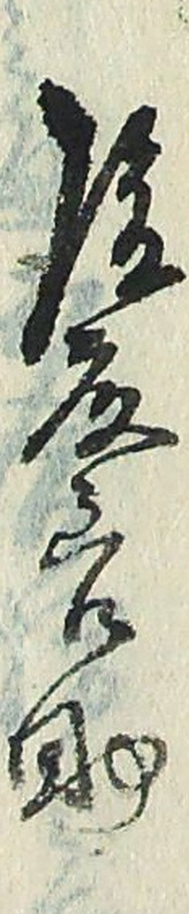後藤善助
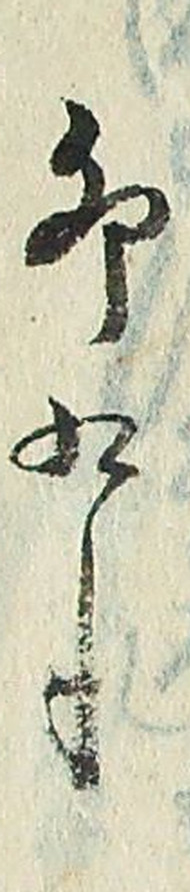卯九月
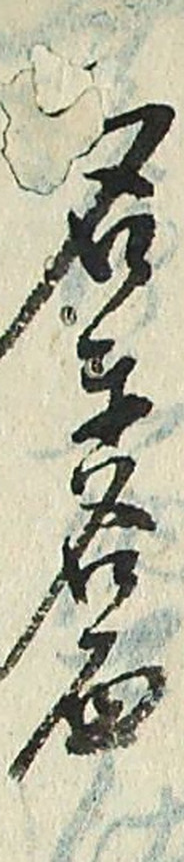名東名西
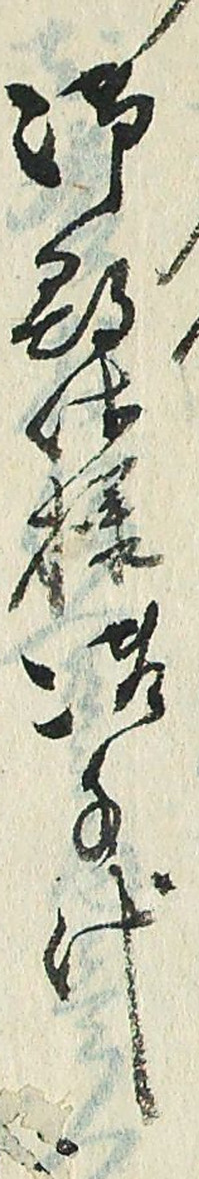御郡代様御手代
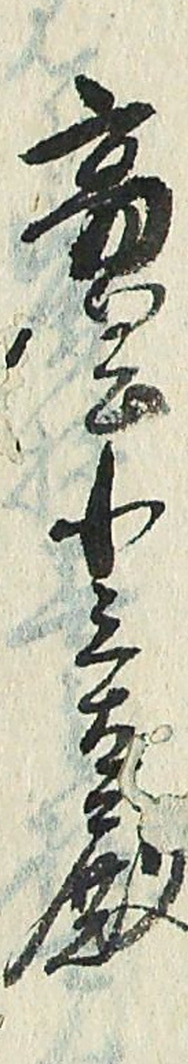高岡小三太殿
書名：諸御用御□受書控
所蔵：鳴門教育大学 Naruto University of Education
